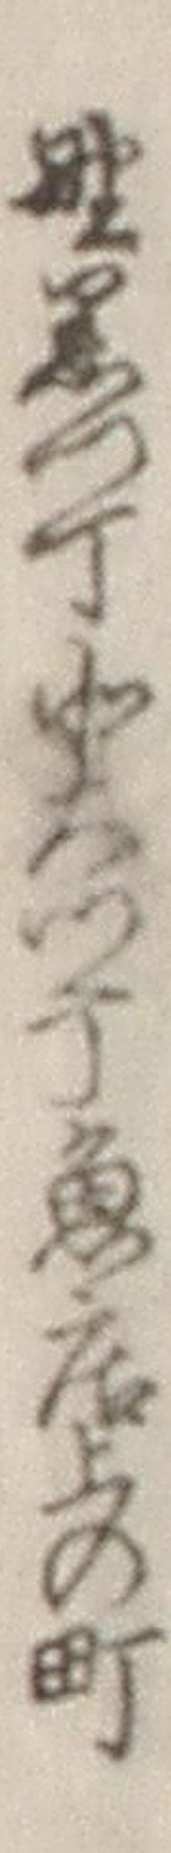野黒門丁北大門丁魚店上の町
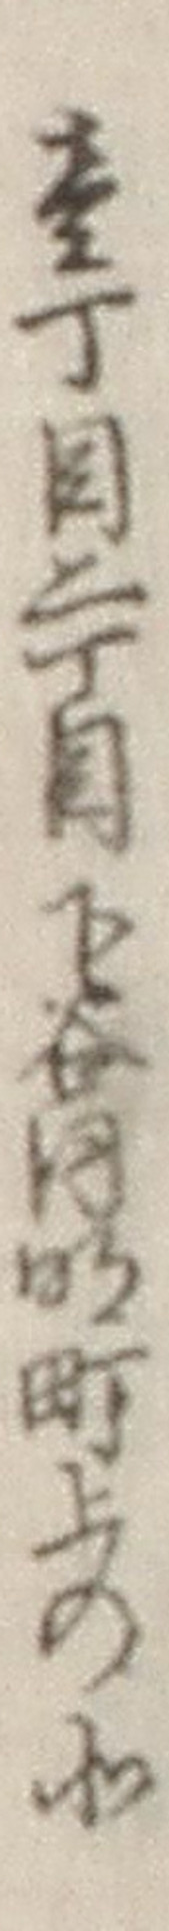壱丁目二丁目下谷円明町上の北
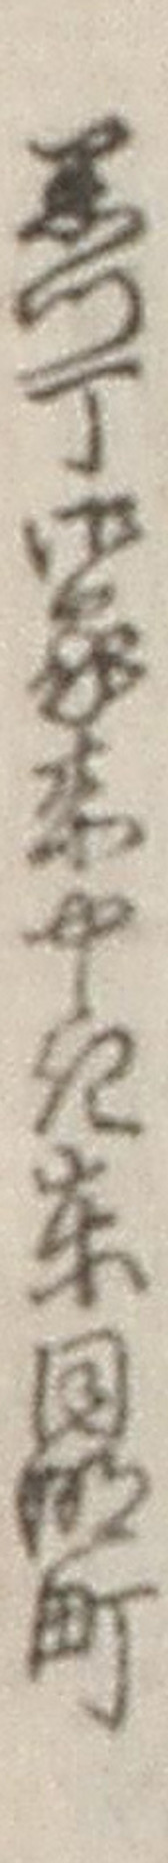黒門町御衆素やき東同明町
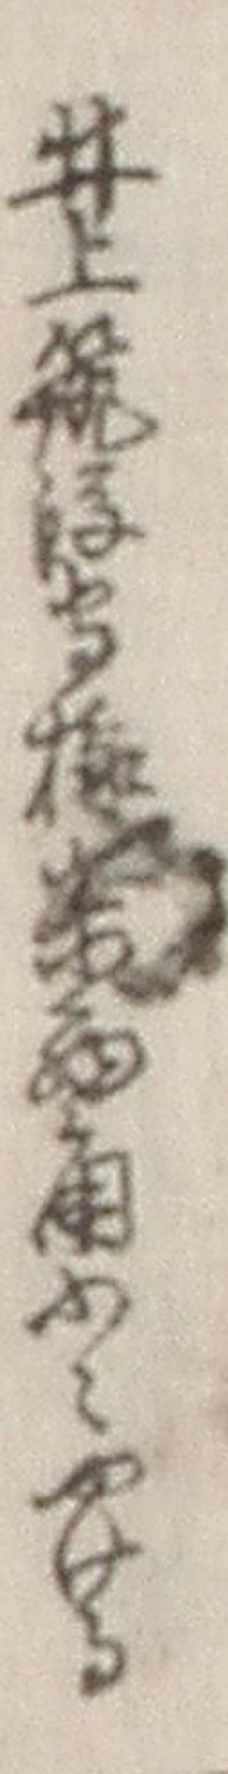井上筑後守様東西角少〻やける
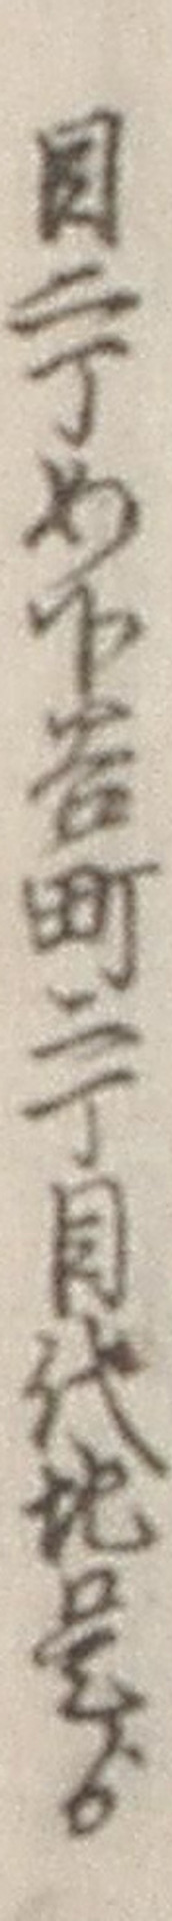目二丁め下谷町二丁目代地是ゟ
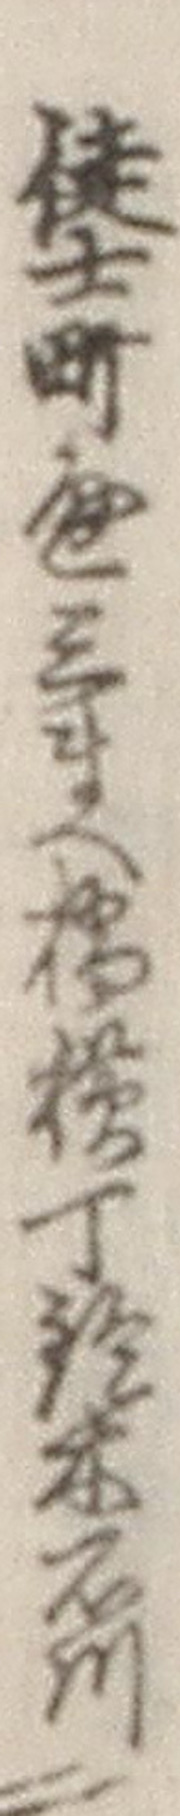徒士町通三まへ橋横丁鈴木石川
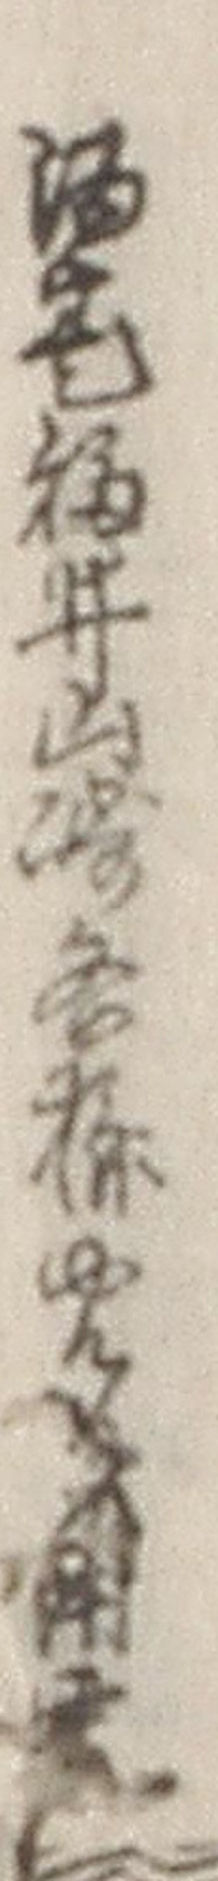酒走福井山崎各様やける
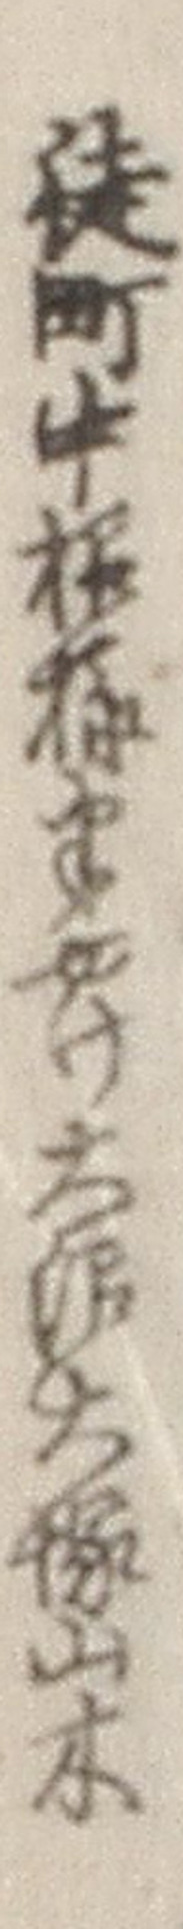徒町中根様半やけ大沼大塚山木
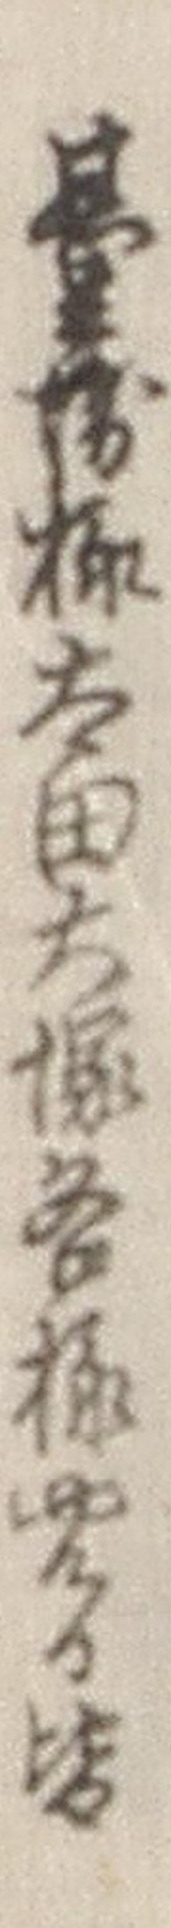其里勝様太田大塚各様やける皆
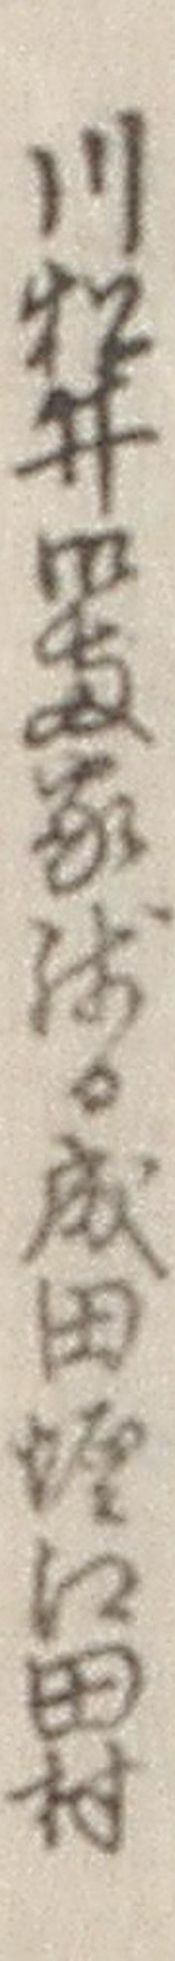川松井御両家残る成田堀江田村
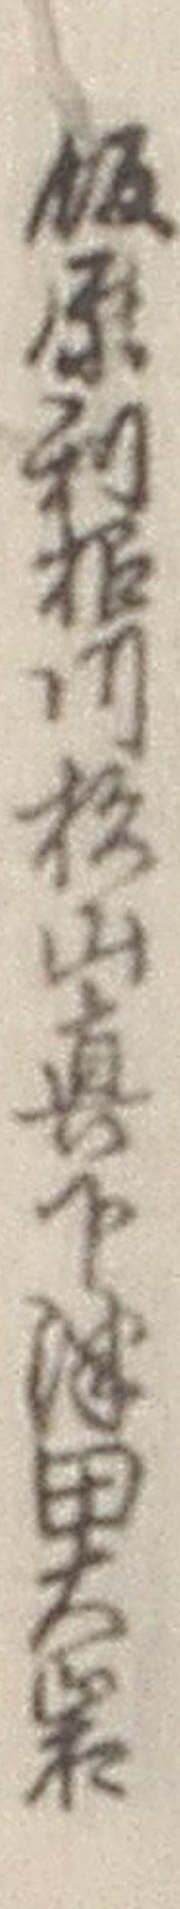飯原利根川松山真下津田大岩
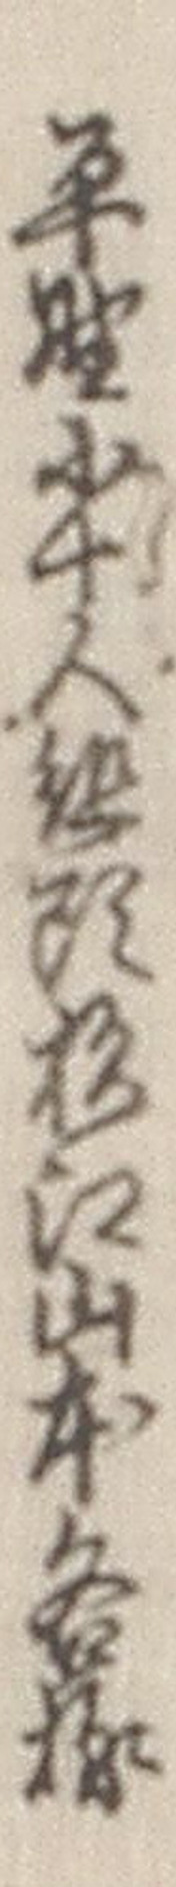平野小住人組頭杉江山本各様
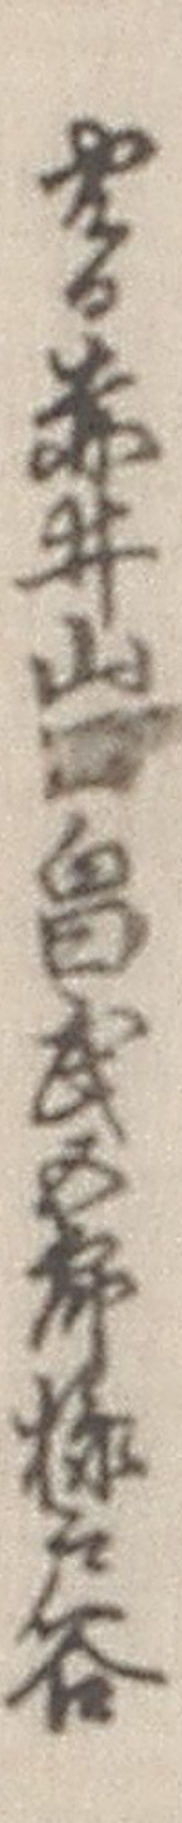やける赤い山畠民五郎様戸谷
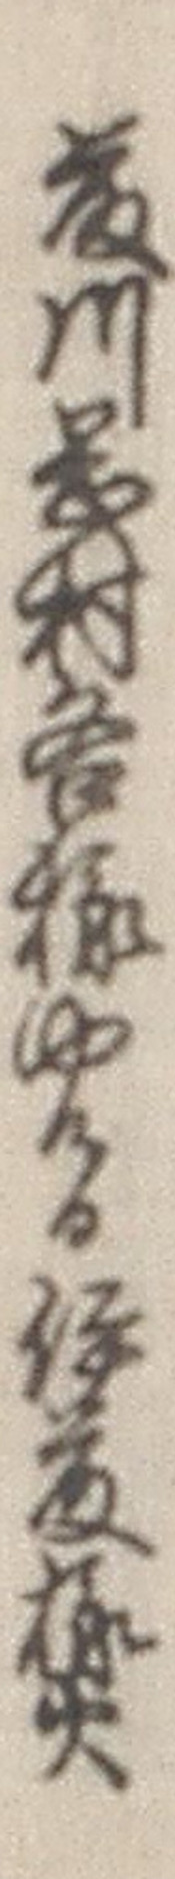藤川岡村各様やける伊藤様火
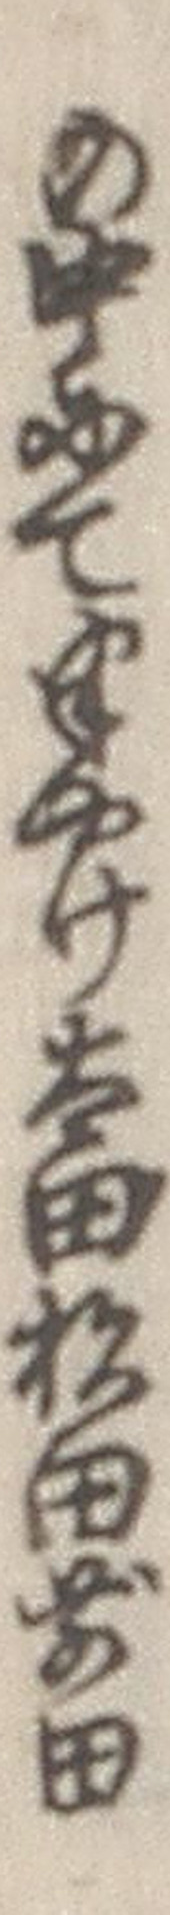の中にて半やけ太田松田前田
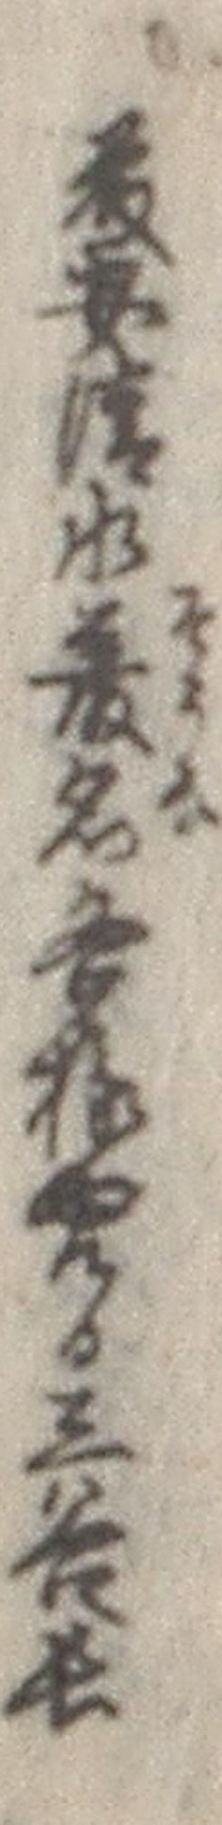箒安清水箒名各様やける三谷長
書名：江戸　大地震臣細録　全
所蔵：東京大学地震研究所図書室 Earthquake Research Institute Library, The University of Tokyo, JAPAN
